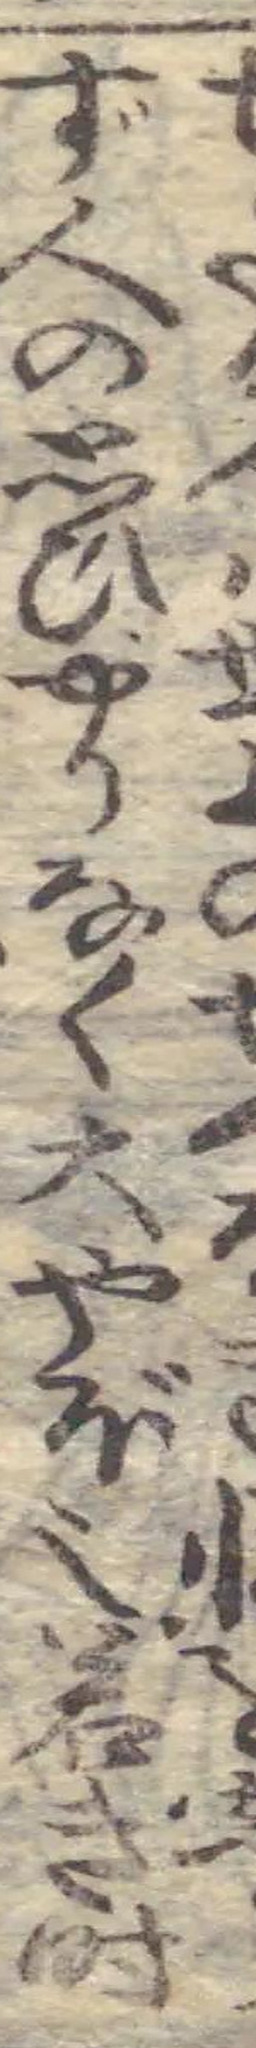ず人の思ひやりなく大やぼ也若き時
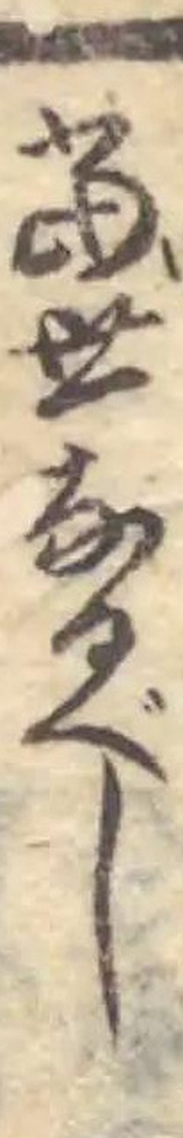当世なるべし
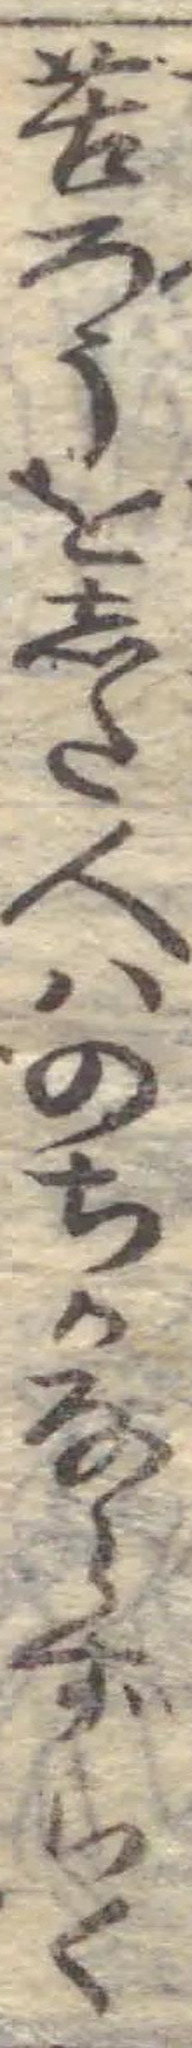苦ろうをした人はのちかならずらく
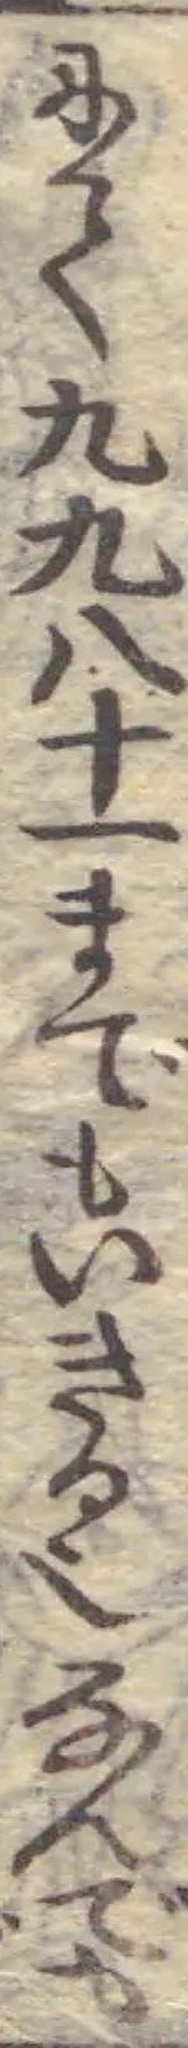にて九九八十一までもいきる也なんでも
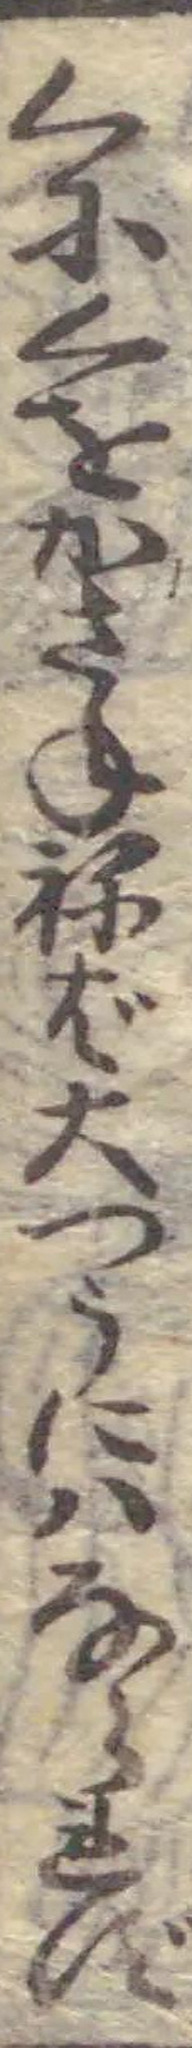くにくをかさねねば大つうにはなられず
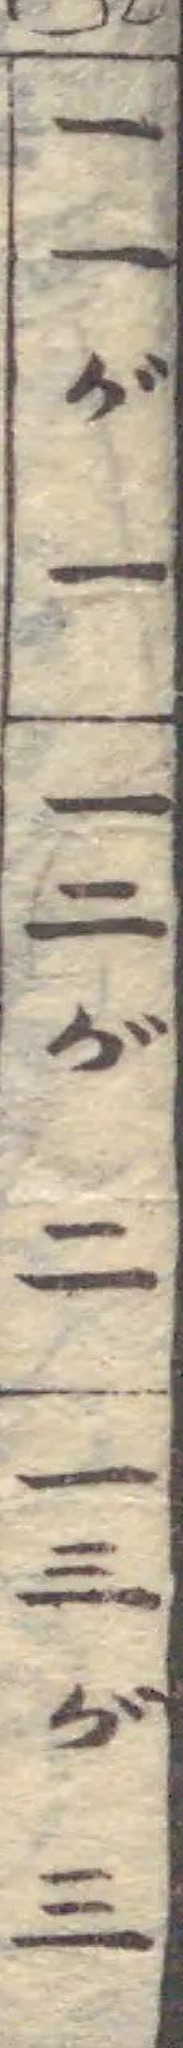一一が一一二が二一三が三
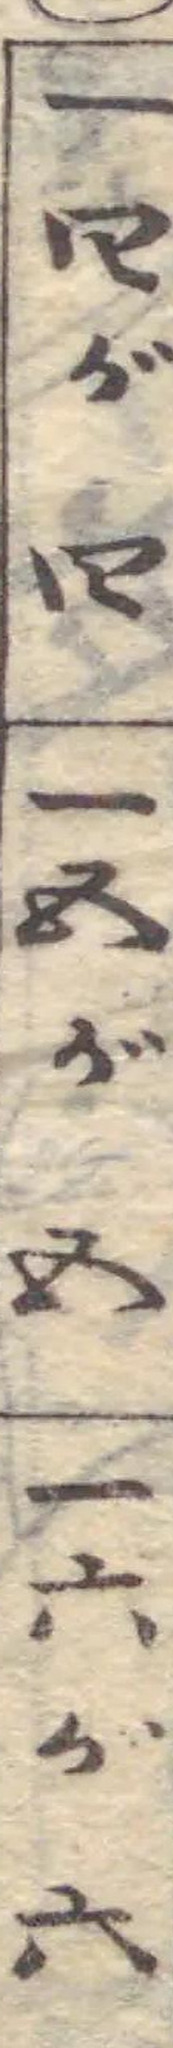一四が四一五が五一六が六
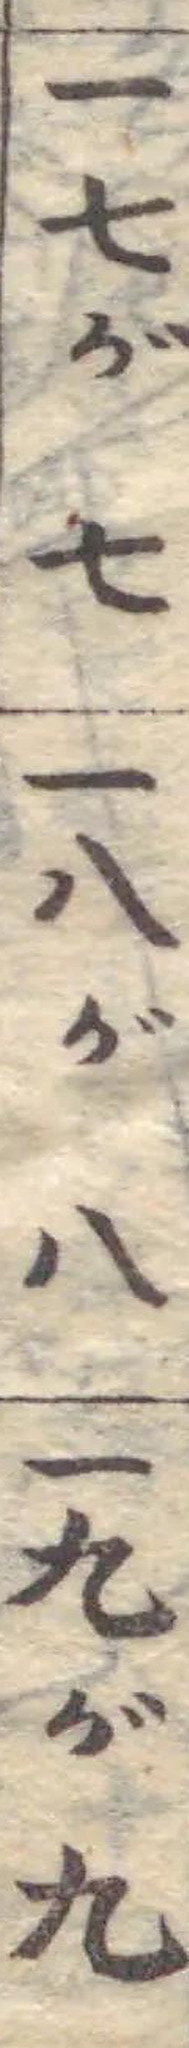一七が七一八が八一九が九
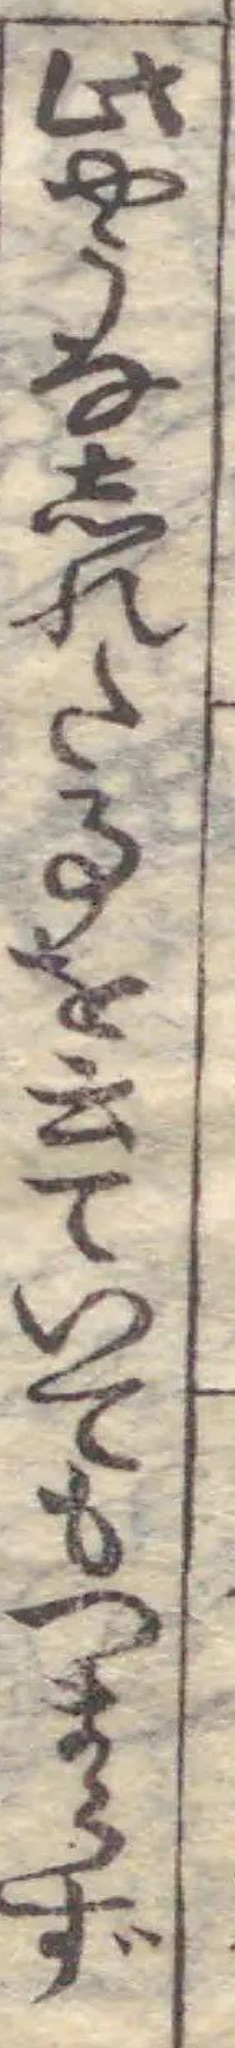此やうなしれた事を云ていてもつまらず
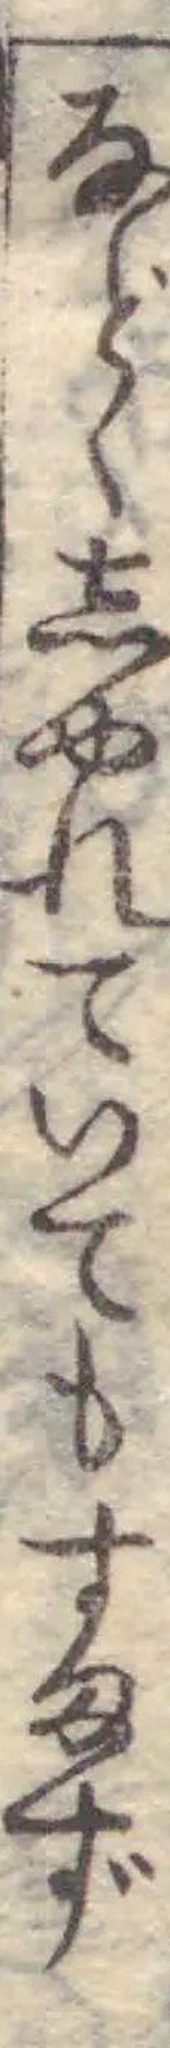などゝしやれていてもすまず
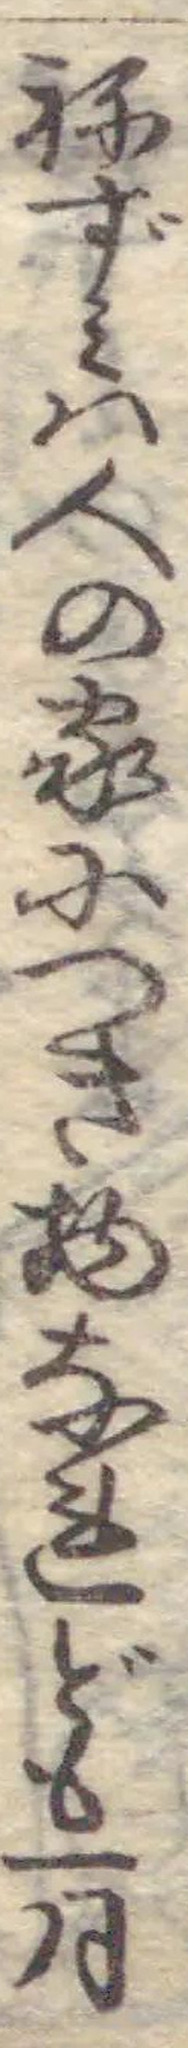ねずみは人の家につき物なれども一月
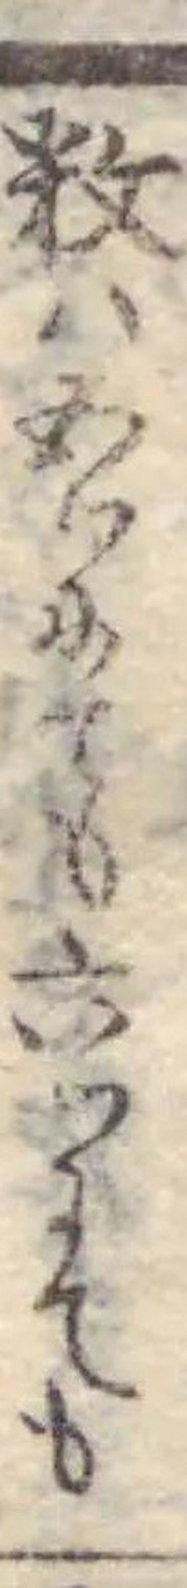数は五つにても六つにても
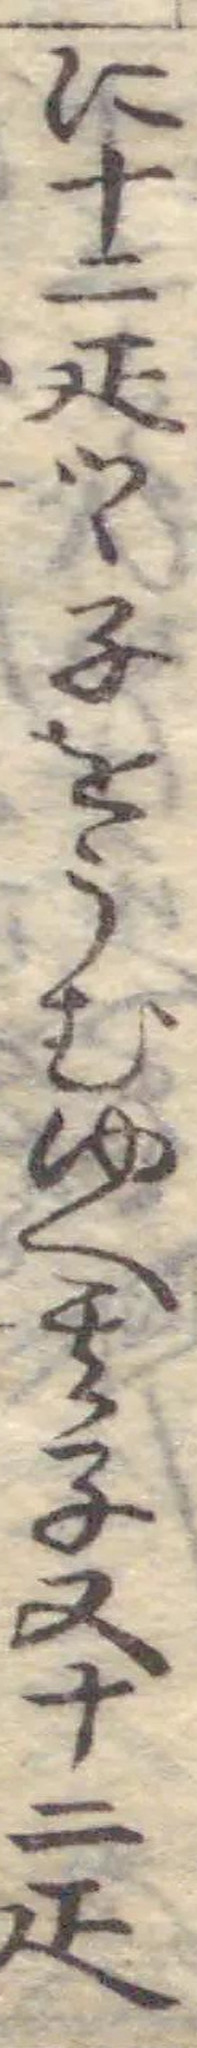に十二疋つゝ子をうむゆへ其子又十二疋
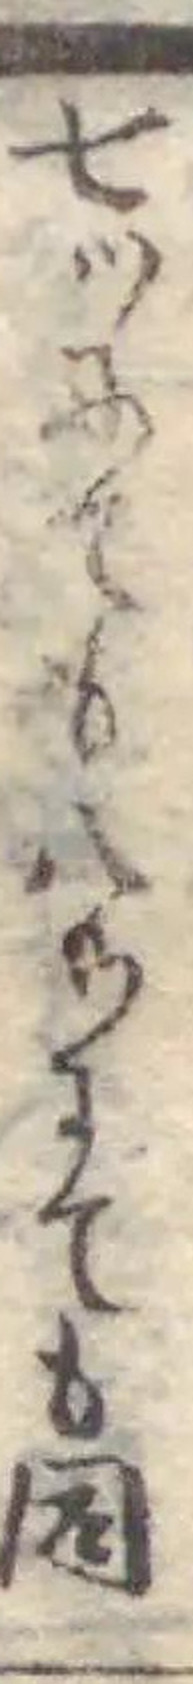七つにても八つにても困
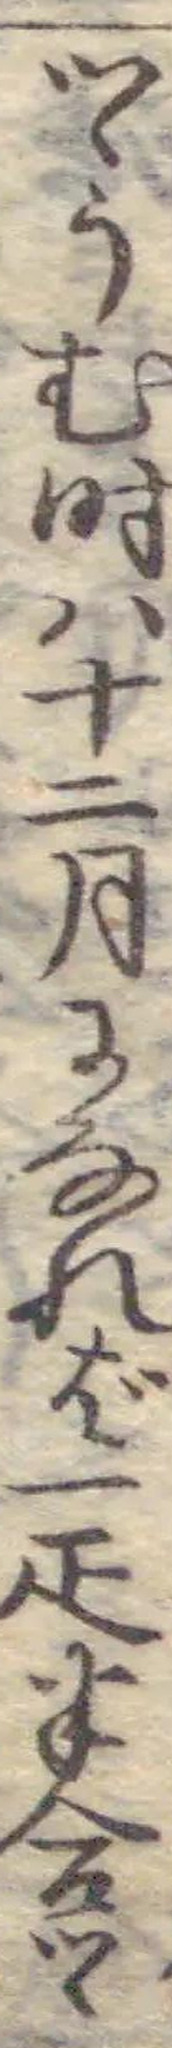つゝうむ時は十二月になれば一疋半合つゝ
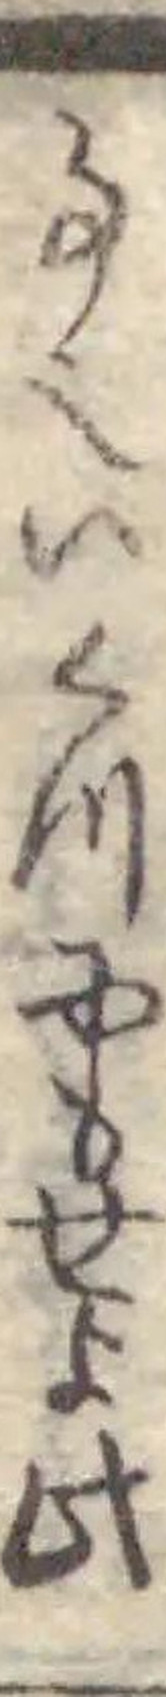事也いくつにもせよ此
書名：大通人好記
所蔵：国立国会図書館 National Diet Library, JAPAN
